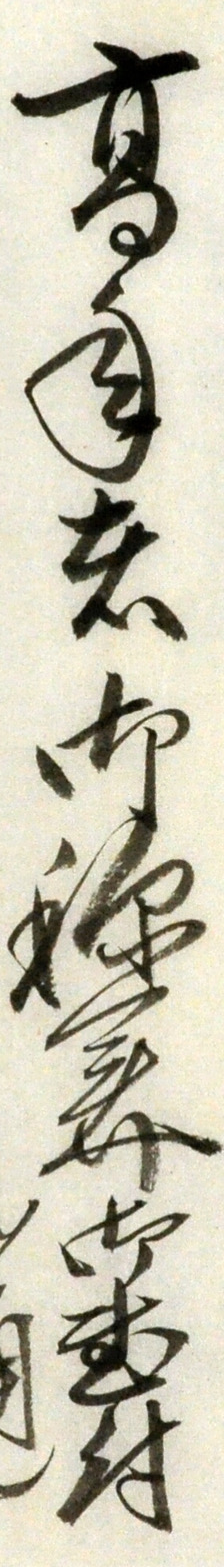高年者御称美御書付

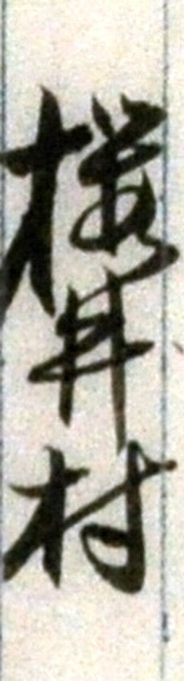桜井村
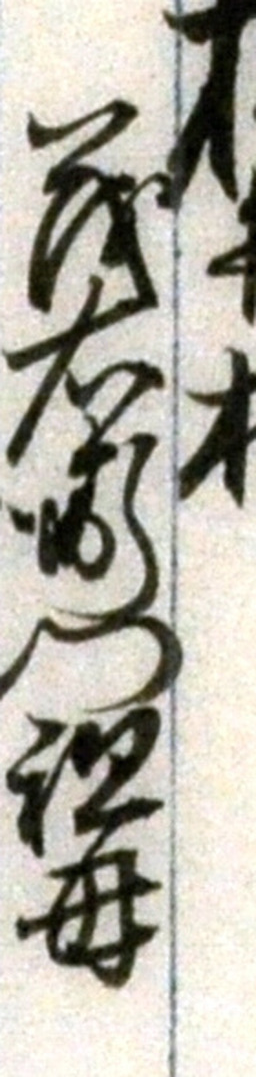茂右衛門祖母
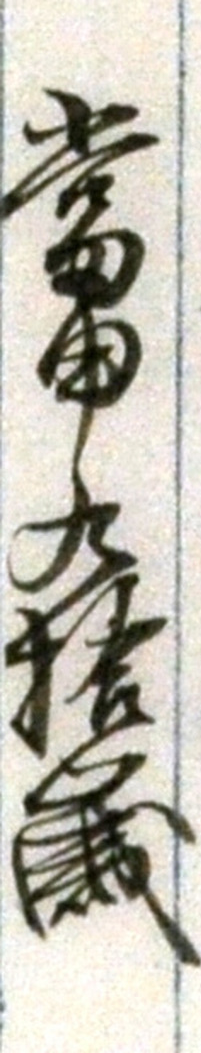当申九拾歳
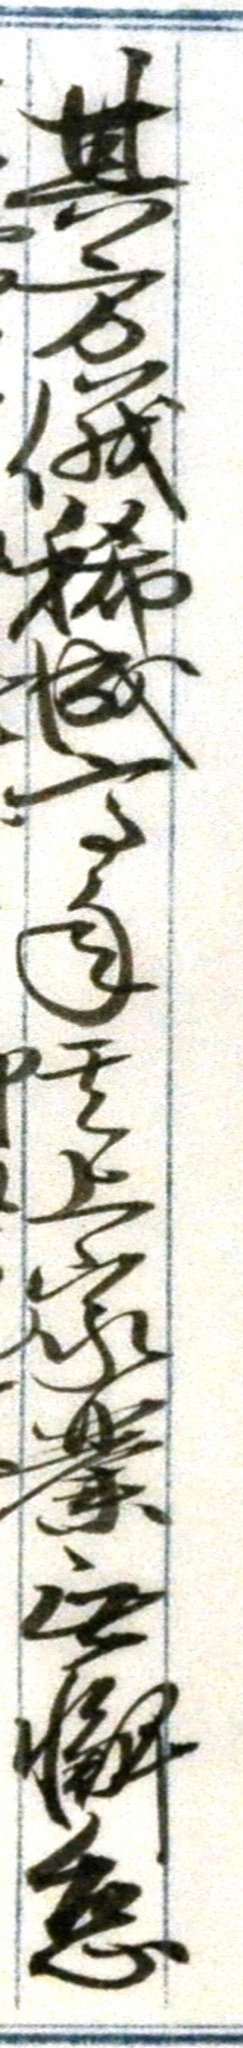其方儀稀成高年其上家業無懈怠
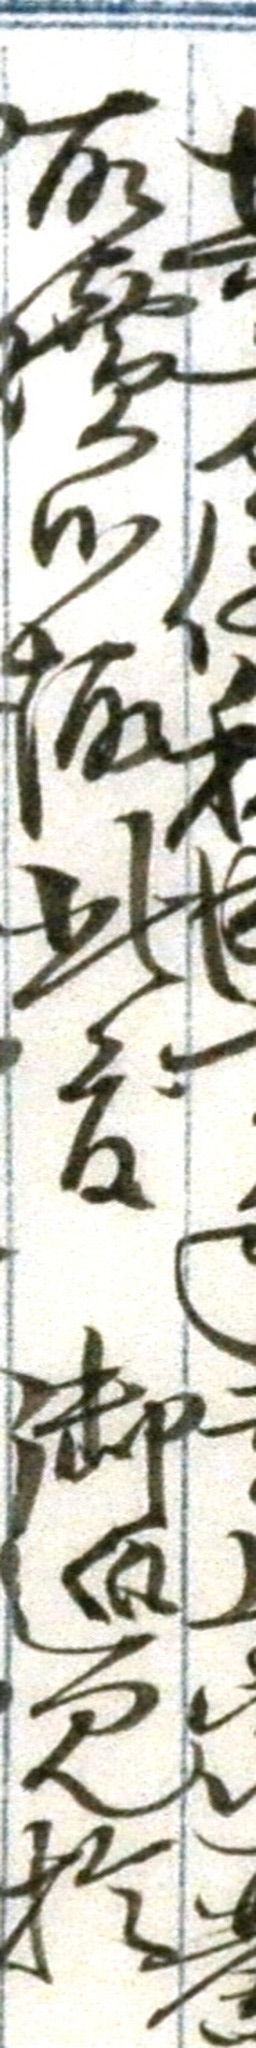取続候趣此度御巡見於
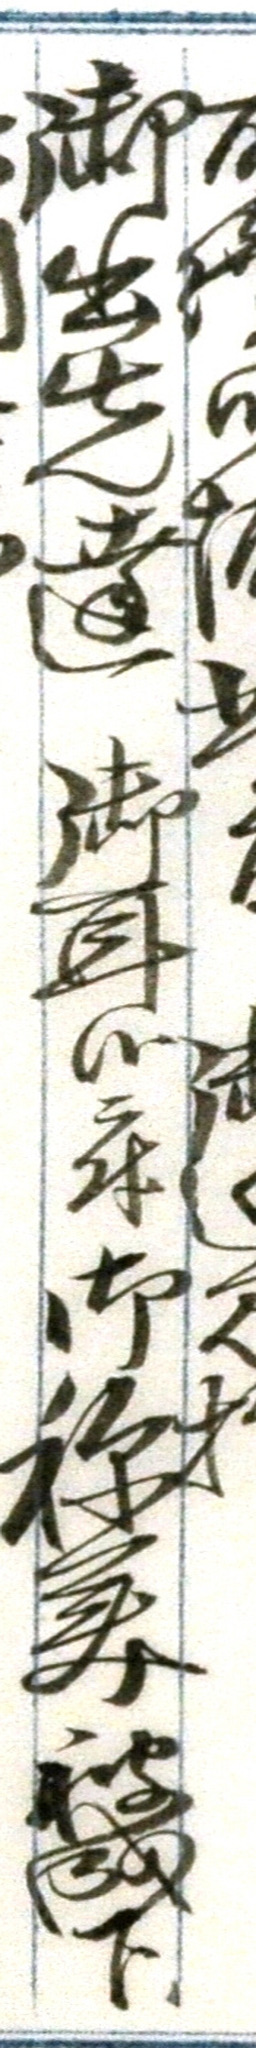御出先達御耳候ニ付御称美被成下
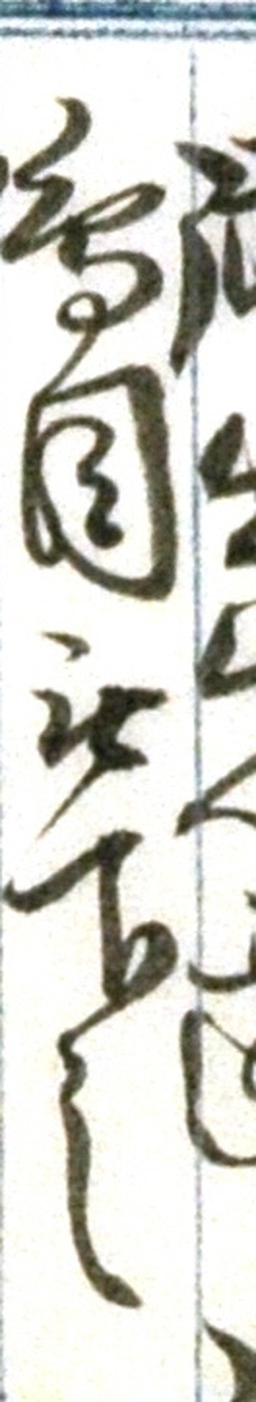鳥目被下之
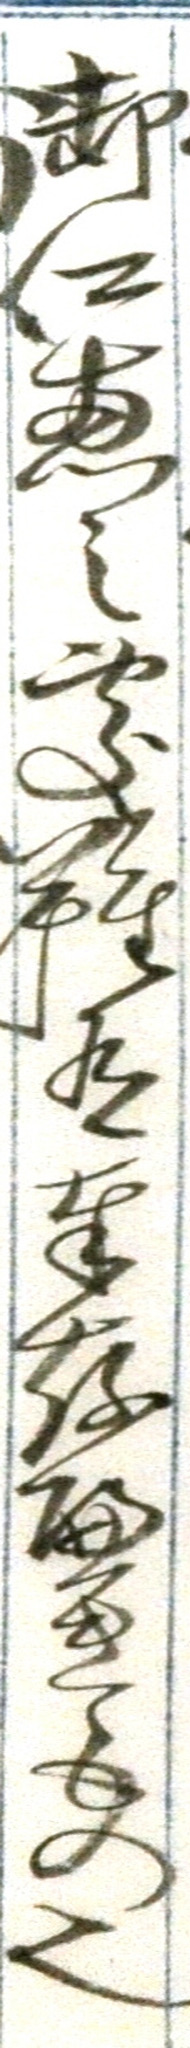御仁恵之所難有奉存へきもの也

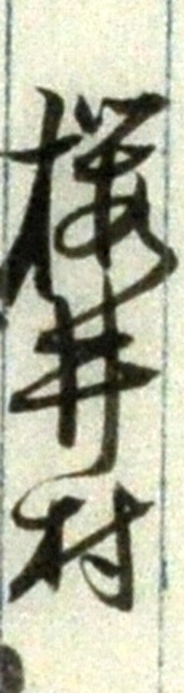桜井村
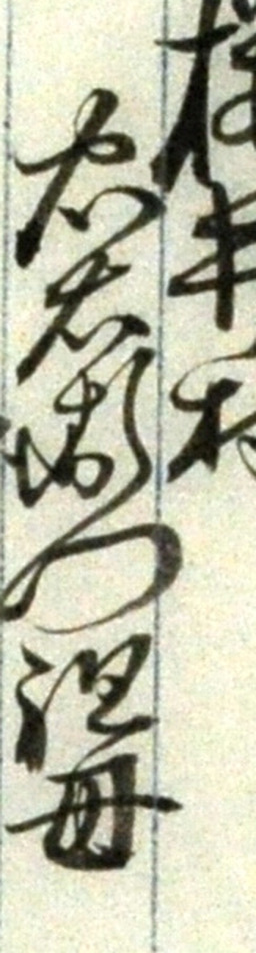忠右衛門祖母
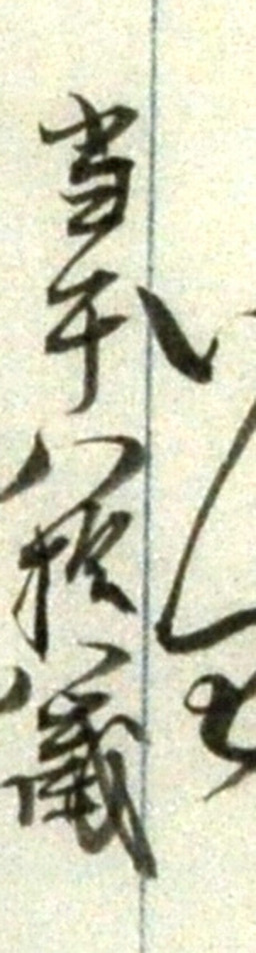当午八拾八歳
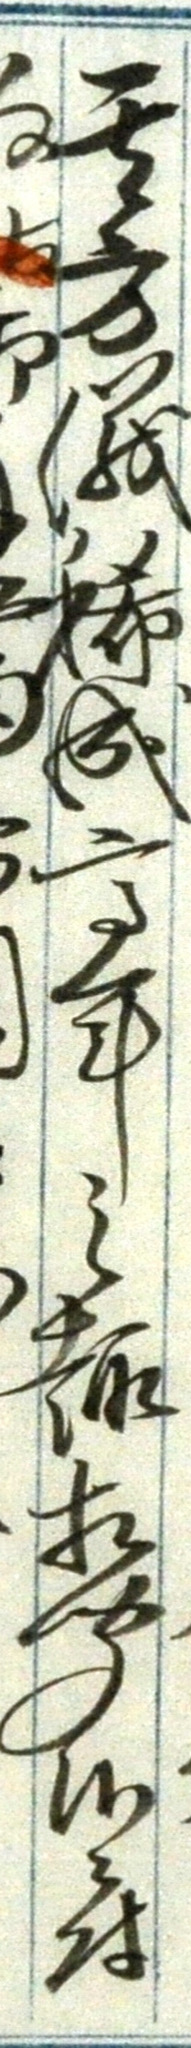其方儀稀成高年之趣相聞候ニ付
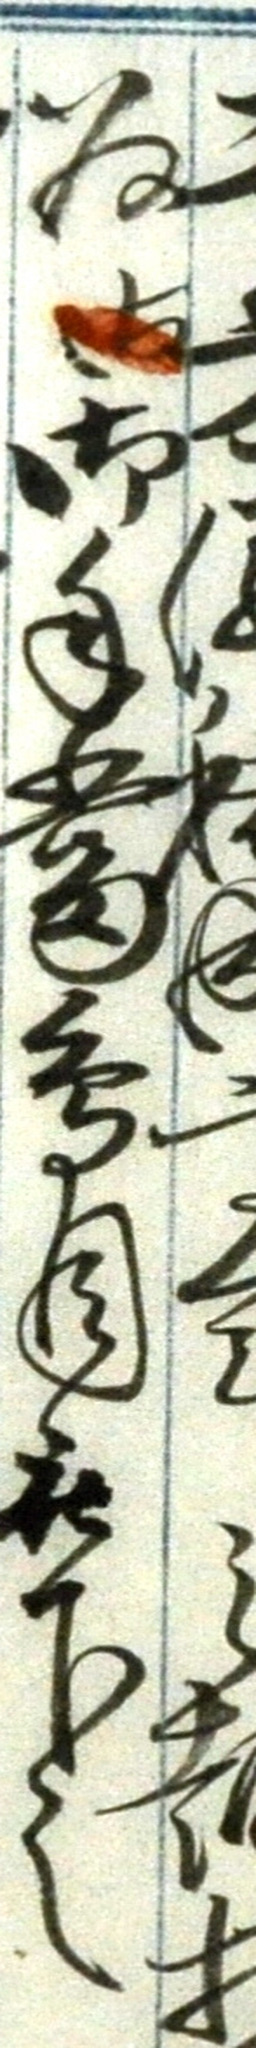為御手当鳥目被下之
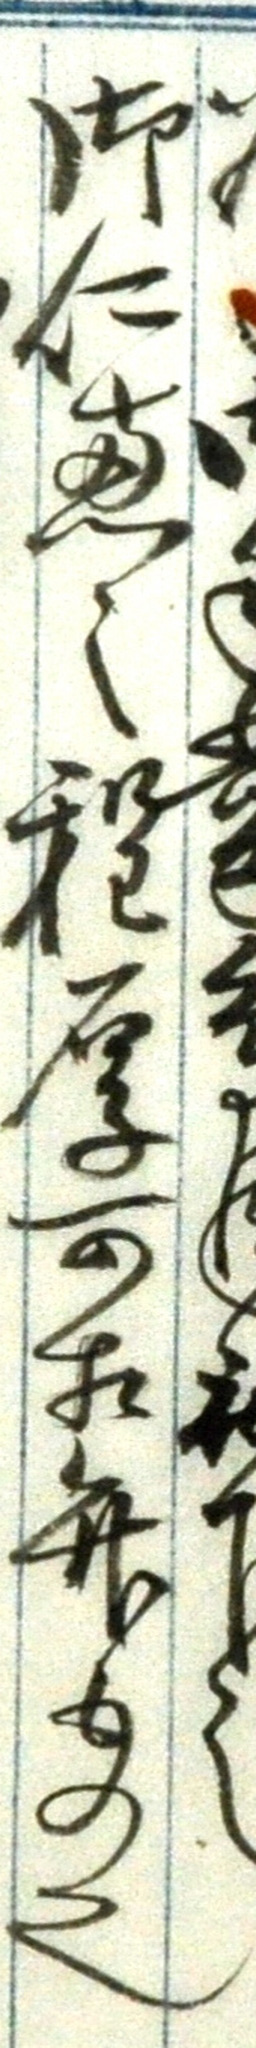御仁恵之程厚可相弁もの也
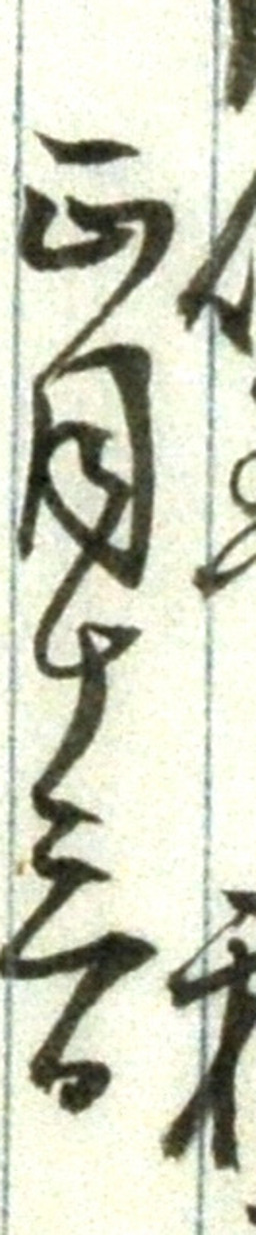正月十三日
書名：高年者御称美御書付
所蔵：伊那市立高遠町図書館・合同会社AMANE
